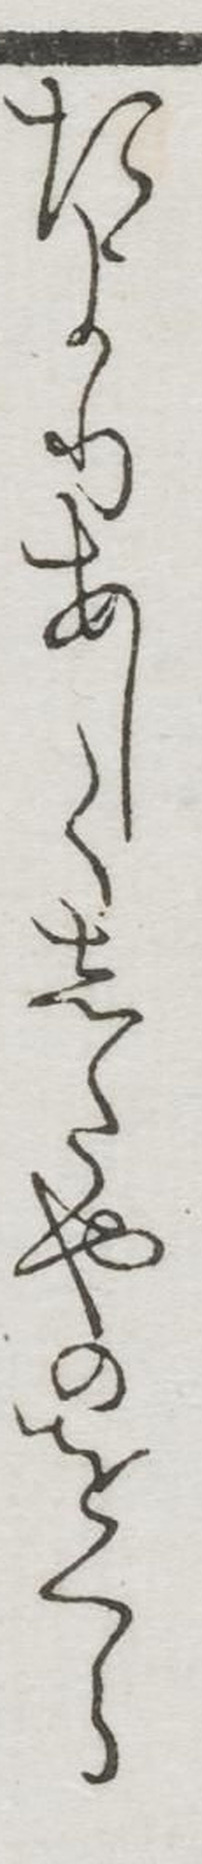たよりあしくしたやのをくら片瀬
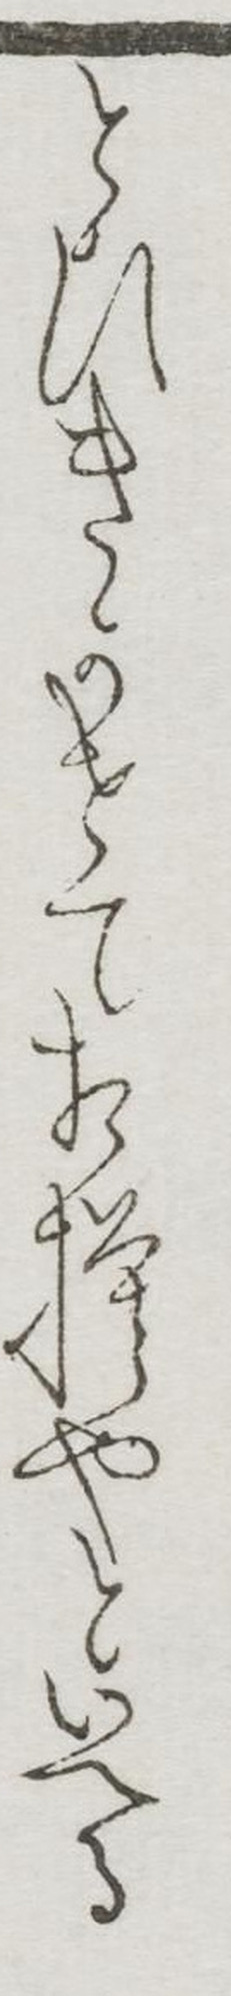とひきかせて相模やといへる
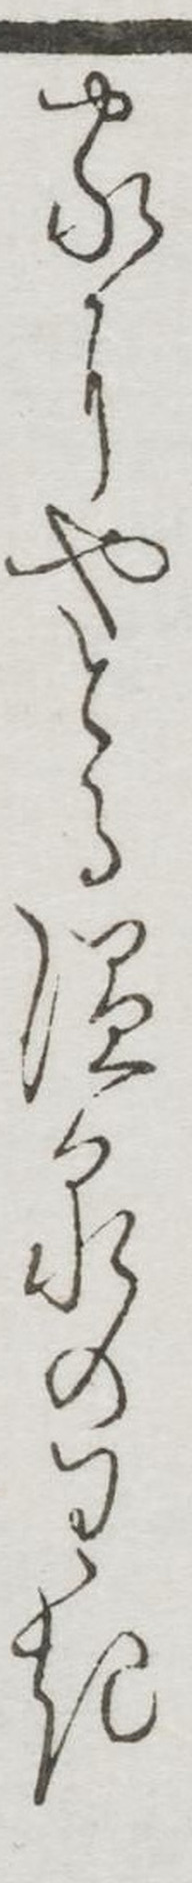家にやとる温泉のわき
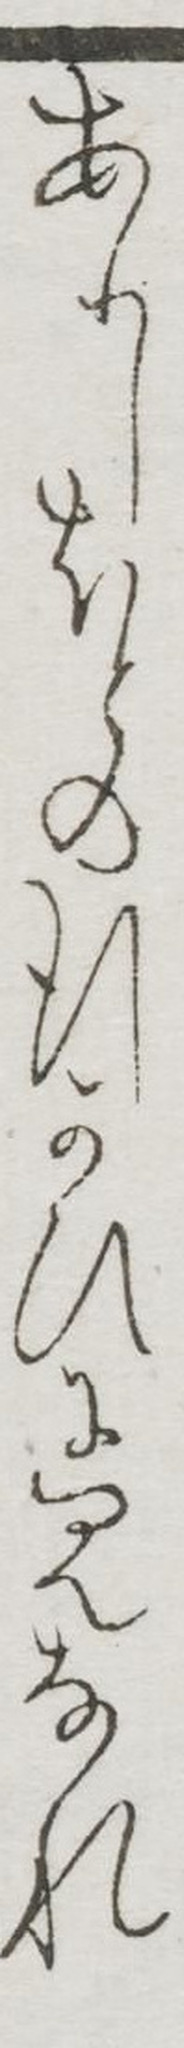ありしほとの行かひに見なれ
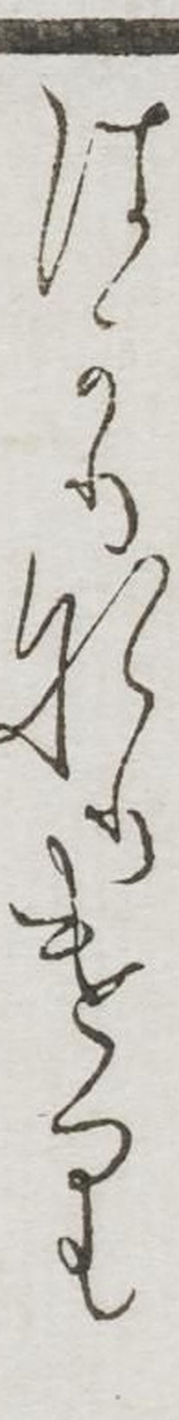はかりなりけり
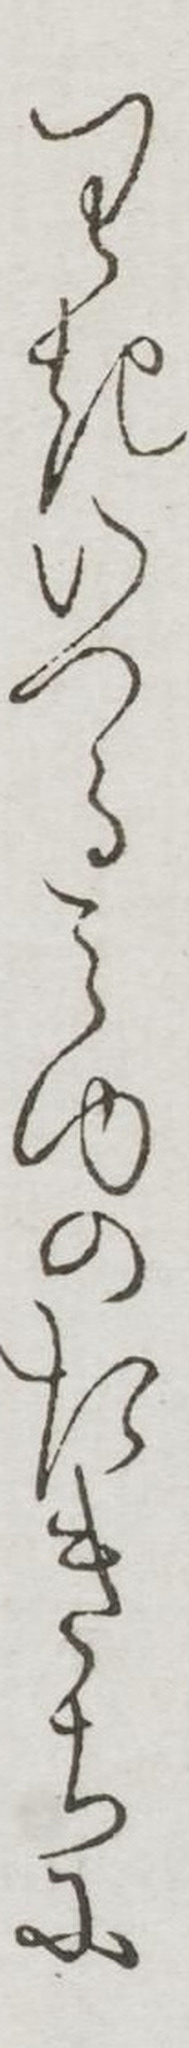わきいつるみゆのたきちに

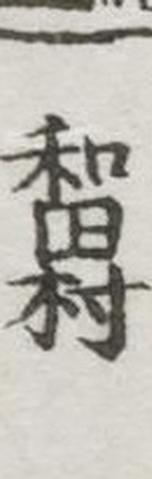和田村

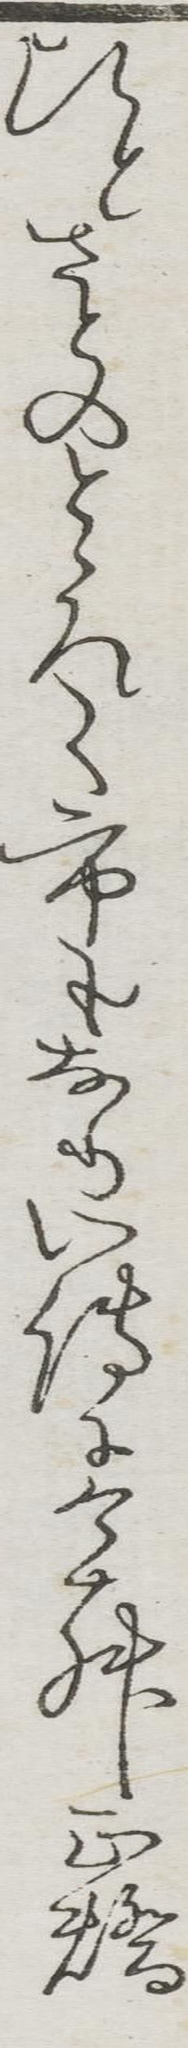ひとさとのところ〳〵市もなりいてにけむ正矯
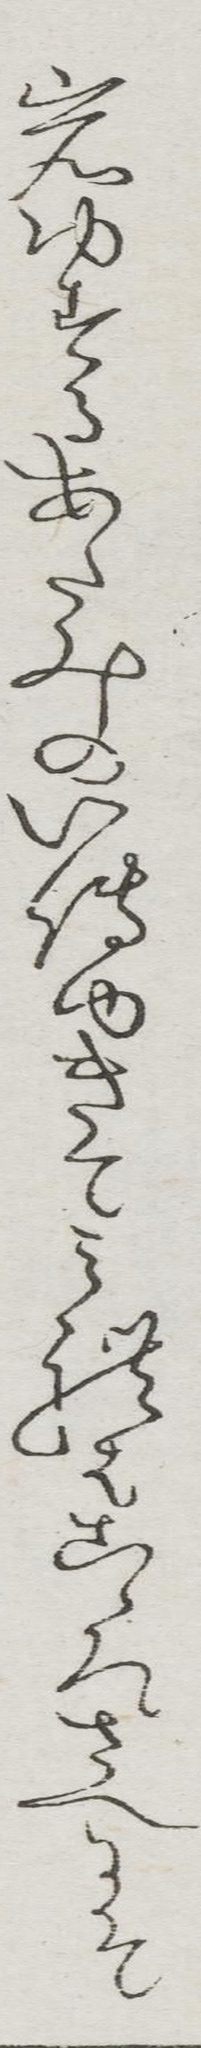岩ゆするあたみのいてゆきてみれはこゝろさへにて
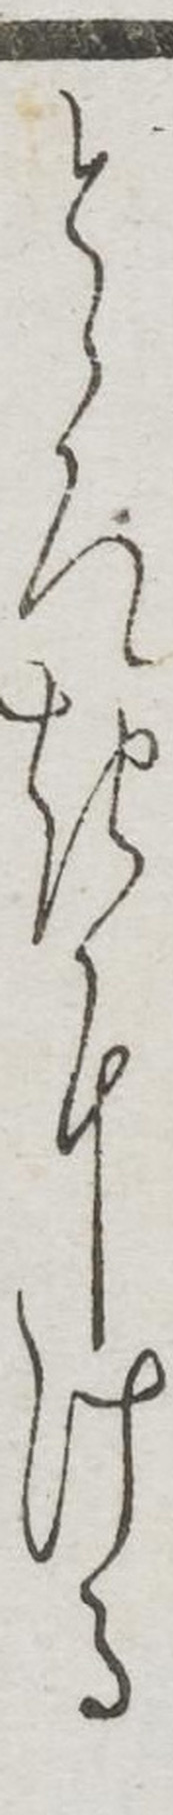ところきにける
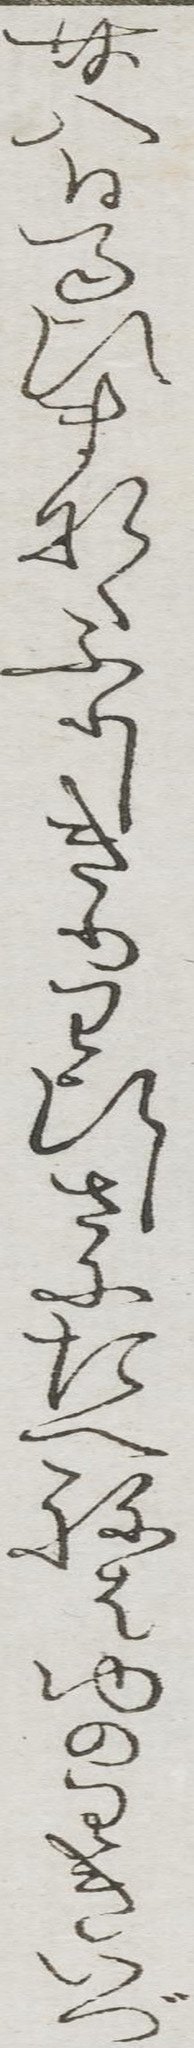廿八日雨ひまなくふりしきりわひしさにたへねはゆのわきいづ
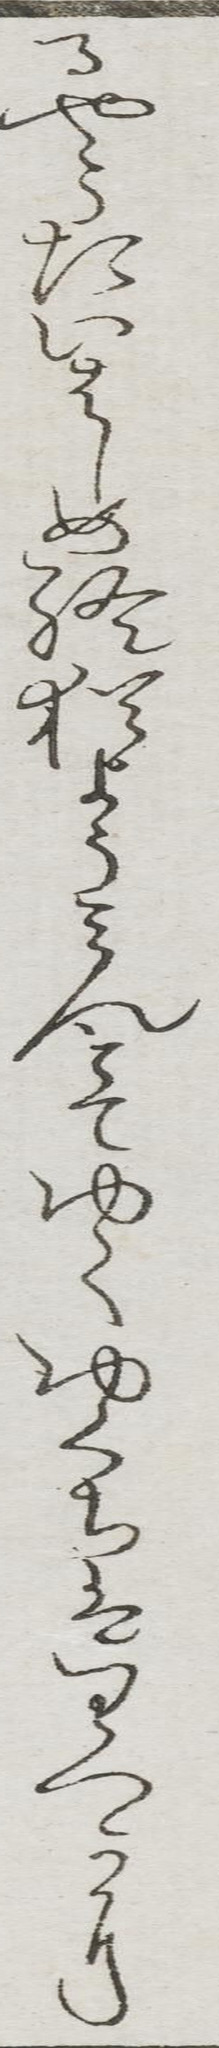るやうたいはしめ給猶ようみんとてゆくゆくちはわつかに
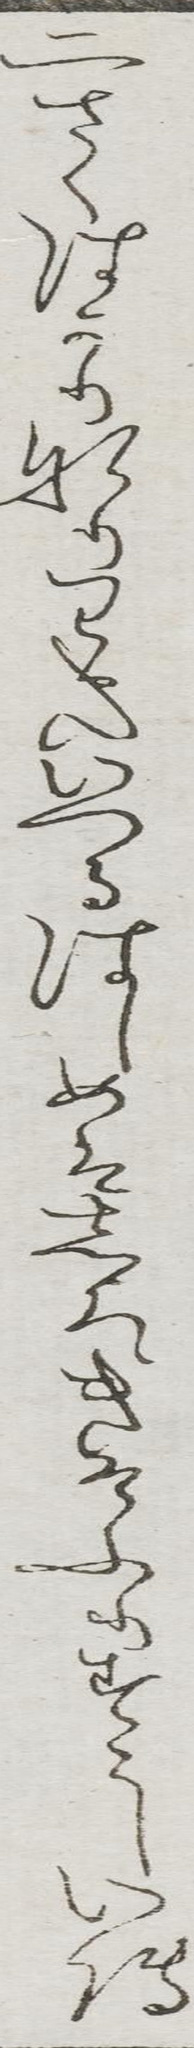二さくはかりなりわきいつるはしめはしろきけふりすこしいて
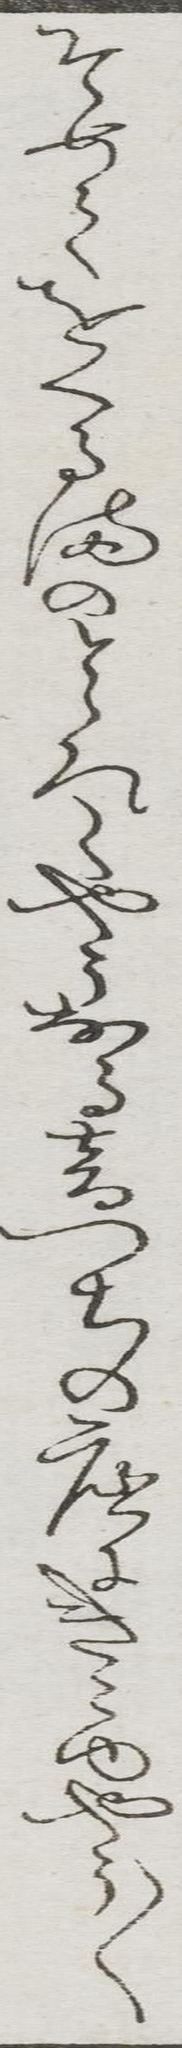そめてをくるまのところ〳〵やうなる音つちの座にきこゆやう〳〵
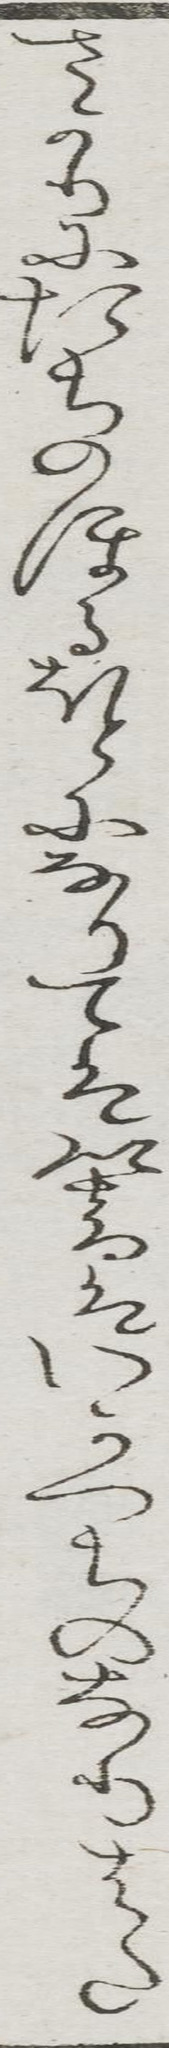さかりにたちのほるほとになりては響はいかつちのなりはた
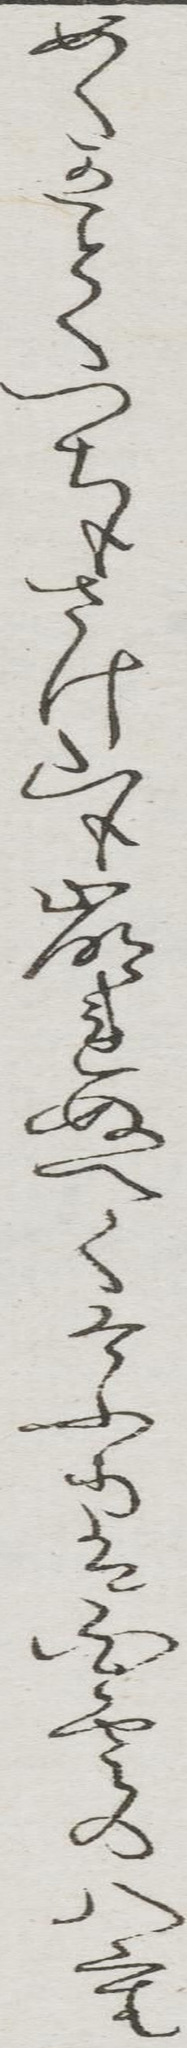めくことくつちもさけ山も崩れぬへくけふりは白雲の八重
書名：挿画熱海日記　全
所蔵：東京大学地震研究所図書室 Earthquake Research Institute Library, The University of Tokyo, JAPAN
